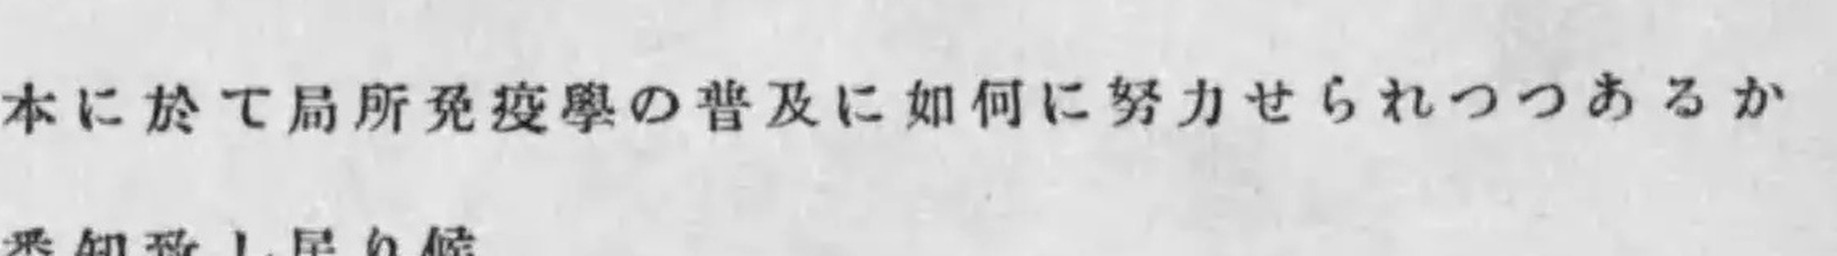日本に於て局所免疫學の普及に如何に努力せられつつあるか
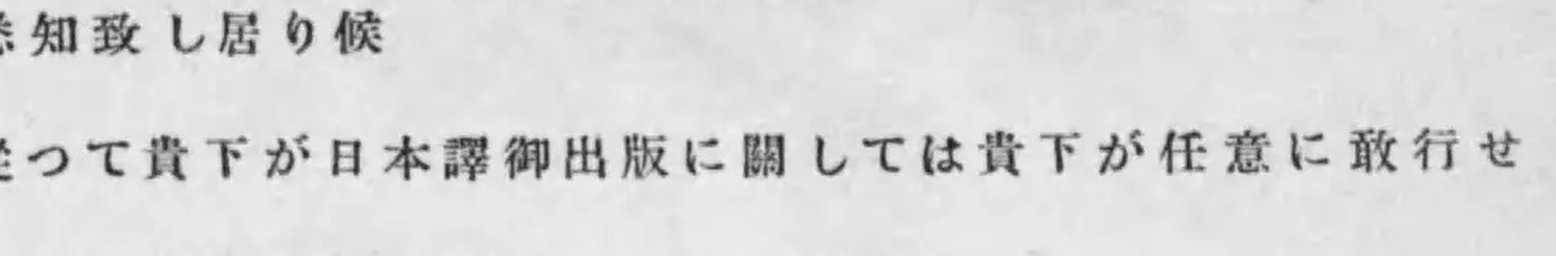従つて貴下が日本譯御出版に關しては貴下が任意に敢行せ
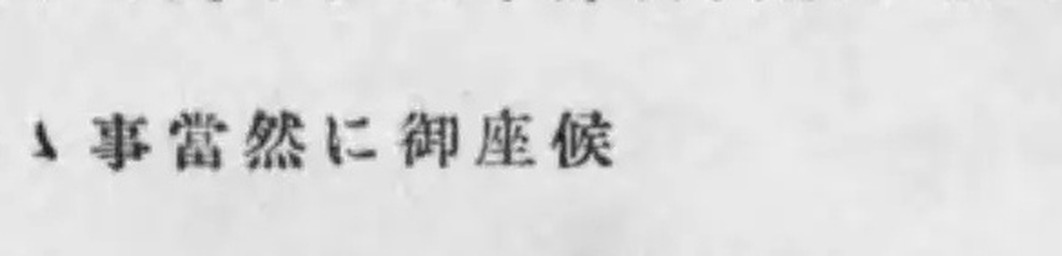らるゝ事當然に御座候
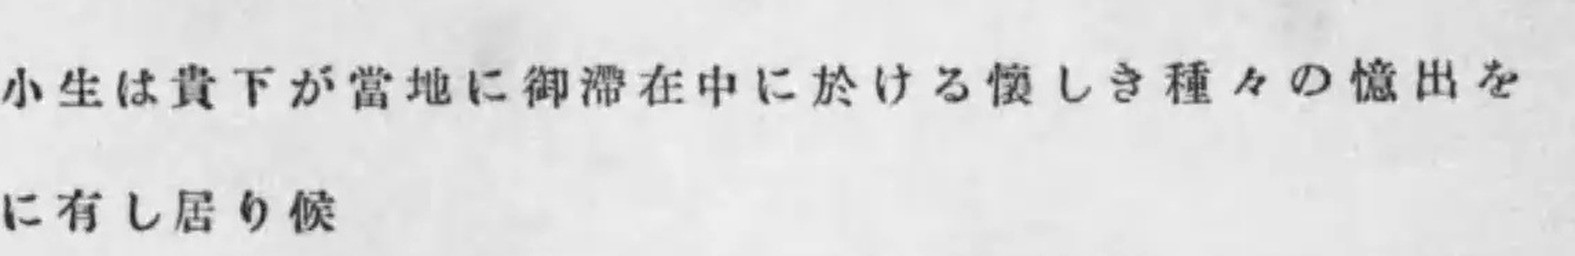小生は貴下が當地に御滞在中に於ける懐しき種々の憶出を
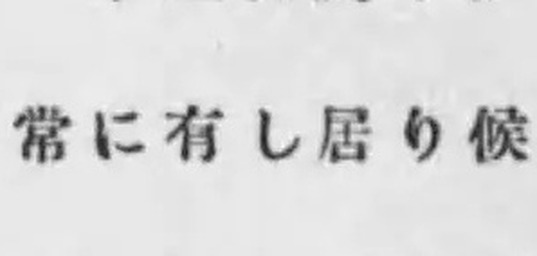常に有し居り候
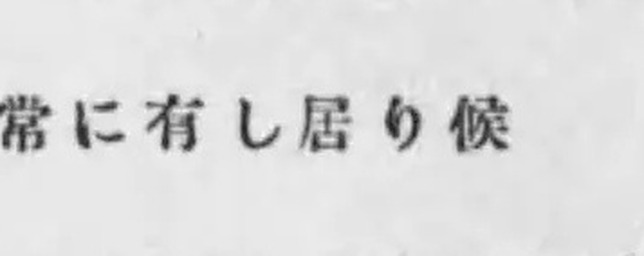常に有し居り候
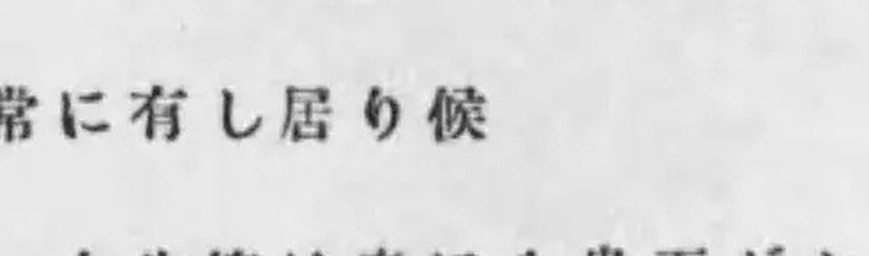常に有し居り候
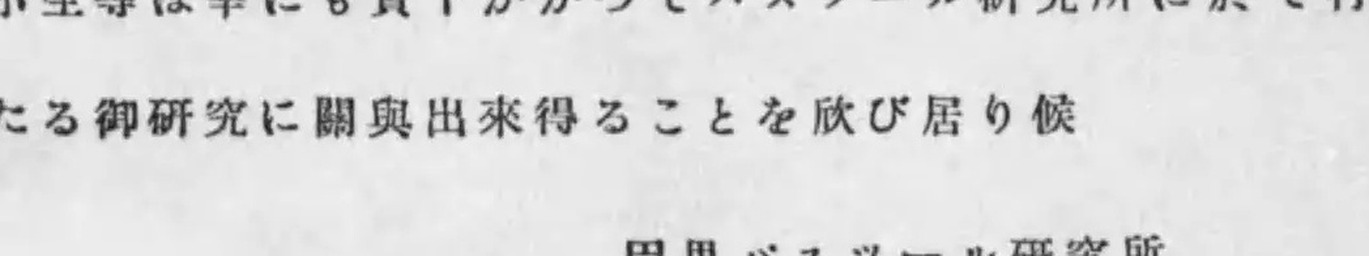れたる御研究に關與出來得ることを欣び居り候

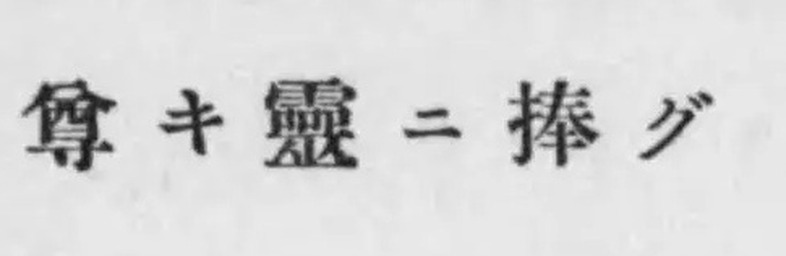ノ尊キ靈ニ捧グ
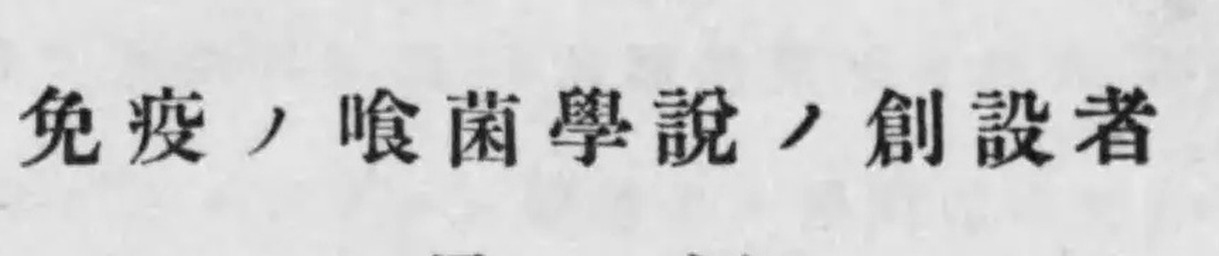免疫ノ喰菌學説ノ創設者

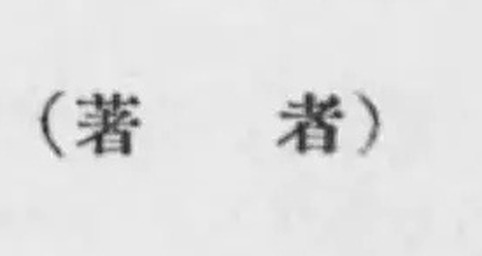(著者)

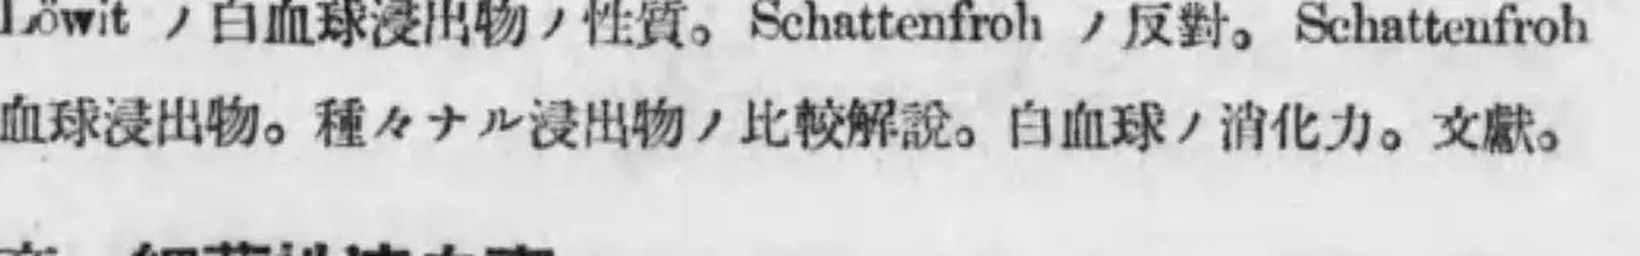の白血球浸出物。種々なる浸出物の比較解説。白血球の消化力。文献。
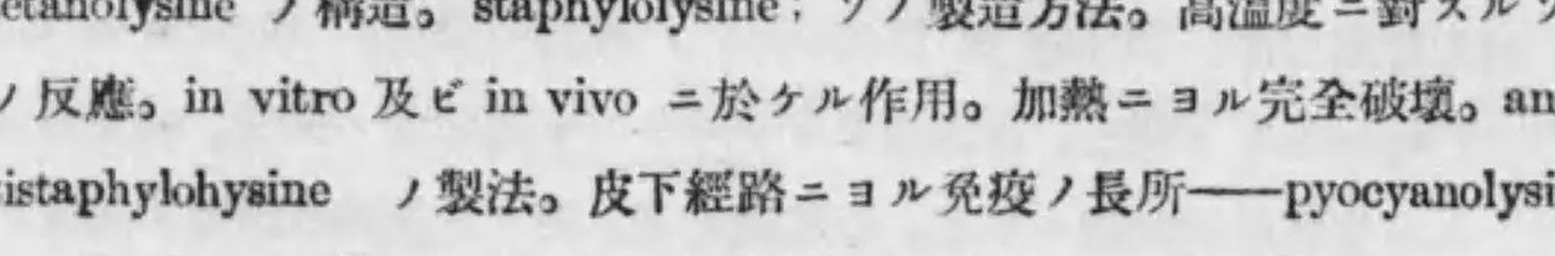の反応。及びに於ける作用。加熱による完全破壊。-
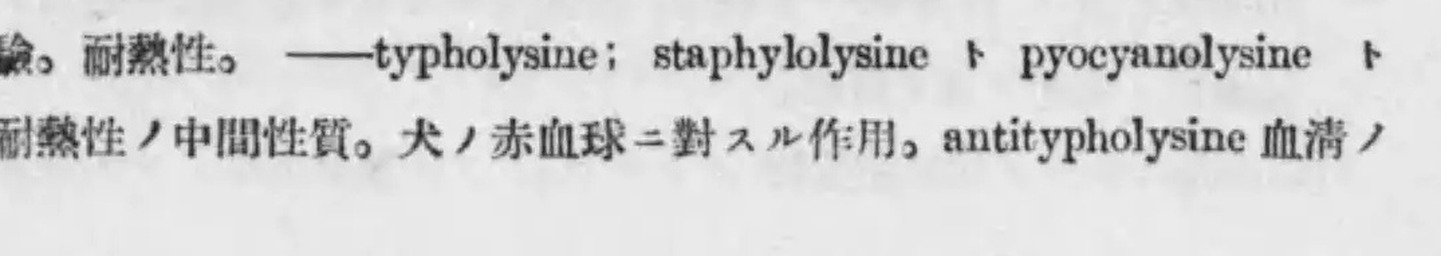の耐熱性の中間性質。犬の赤血球に対する作用。血清の

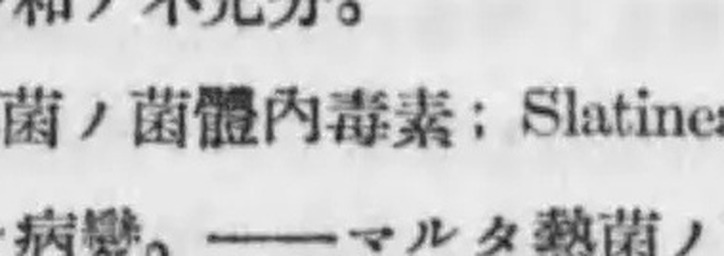菌の菌体内毒素。
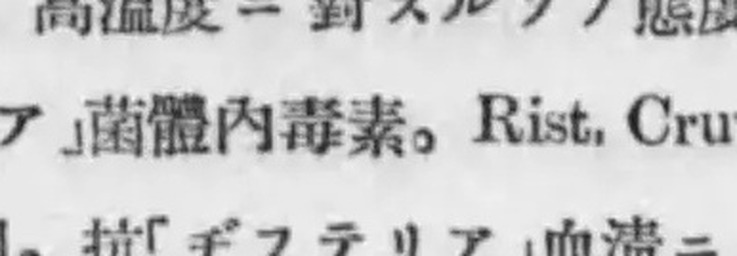菌の菌体内毒素。
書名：伝染病ニ於ケル免疫ニ関スル研究
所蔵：国立国会図書館 National Diet Library, JAPAN
